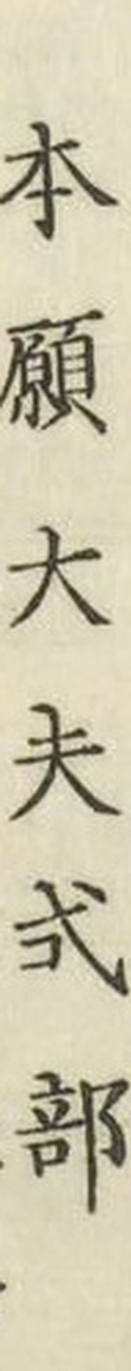本願大夫式部
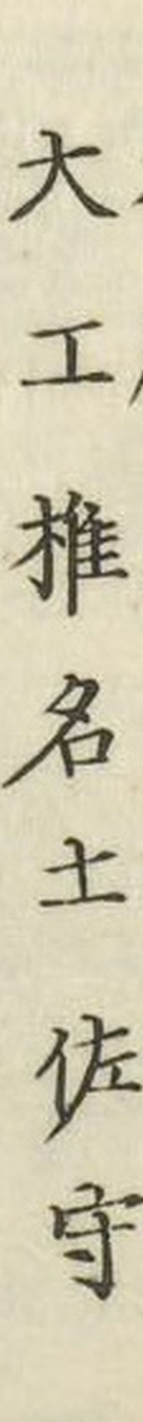大工椎名土佐守
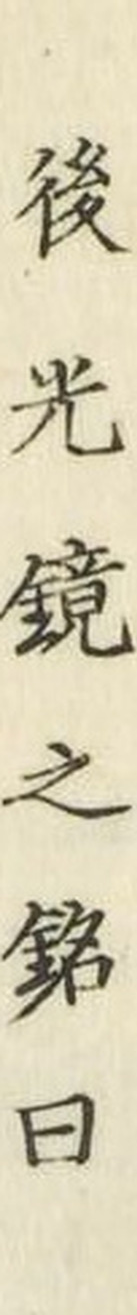後光鏡之銘曰
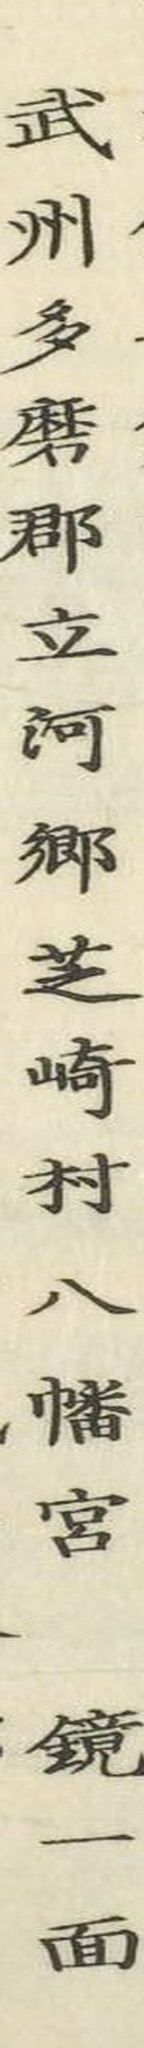武州多磨郡立河郷芝崎村八幡宮鏡一面
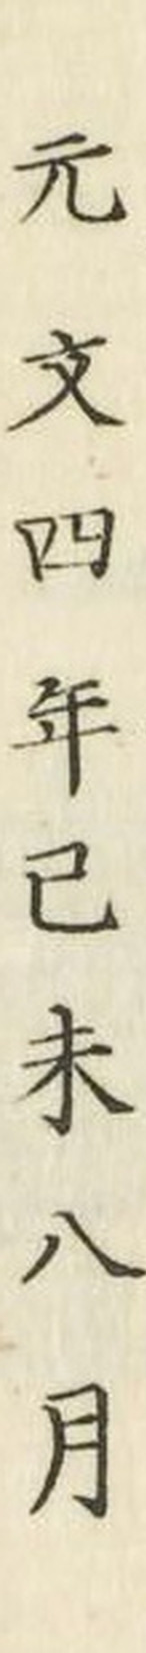元文四年己未八月
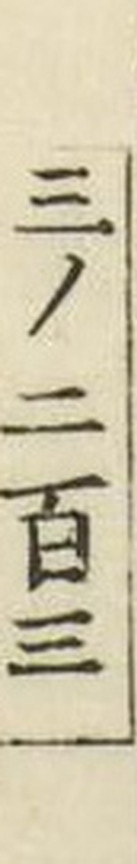三ノ二百三
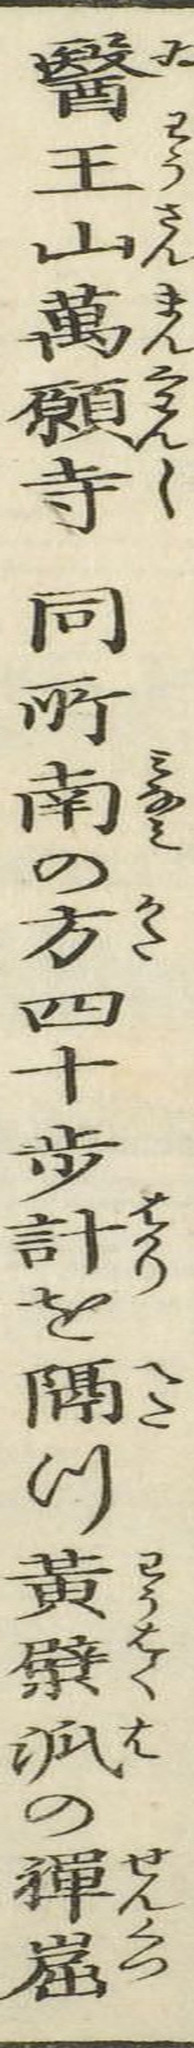医王山萬願寺同所南の方四十歩計を隔つ黄檗派の禅崫
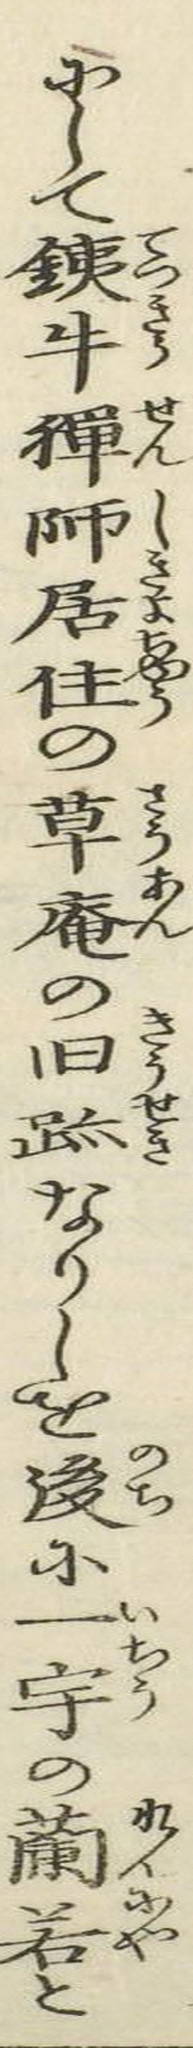にして銕牛禅師居住の草庵の旧跡なりしを後に一宇の蘭若と
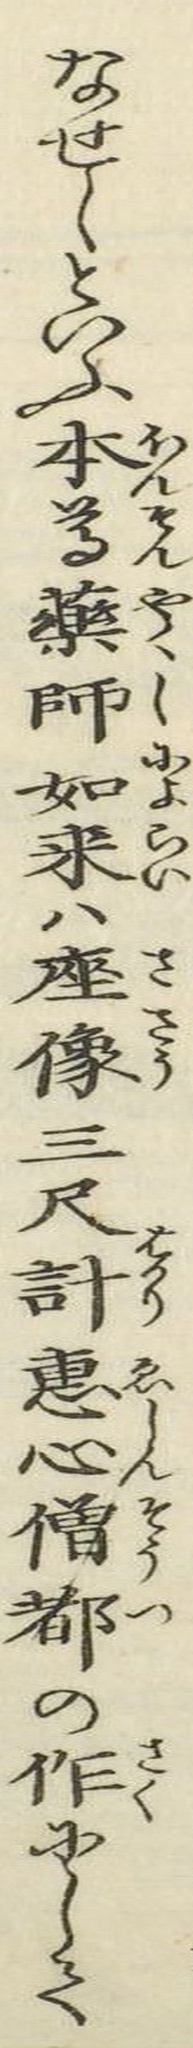なせしといふ本尊薬師如来は座像三尺計恵心僧都の作にして
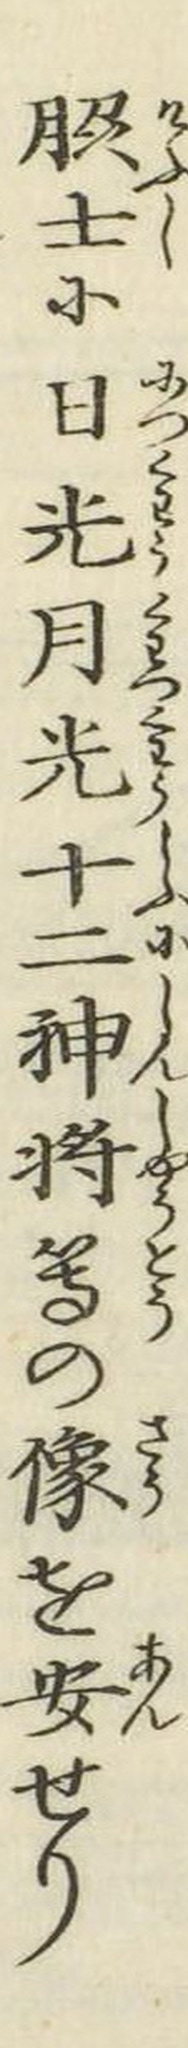脇士に日光月光十二神将等の像を安せり
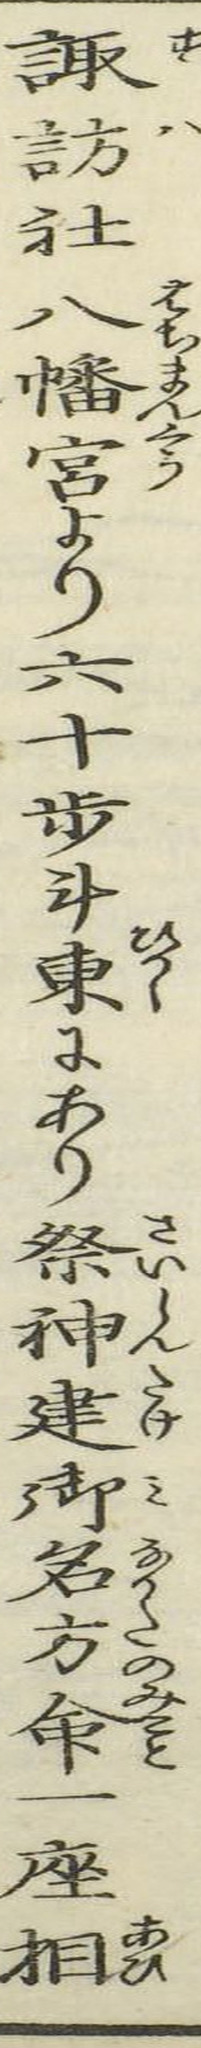諏訪社八幡宮より六十歩計東にあり祭神建御名方命一座相
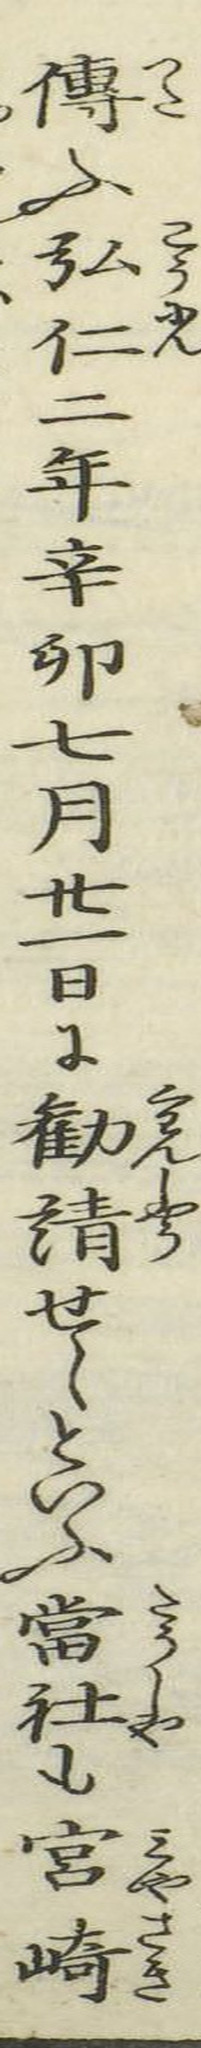伝ふ弘仁二年辛卯七月廿一日に勧請せしといふ当社も宮崎
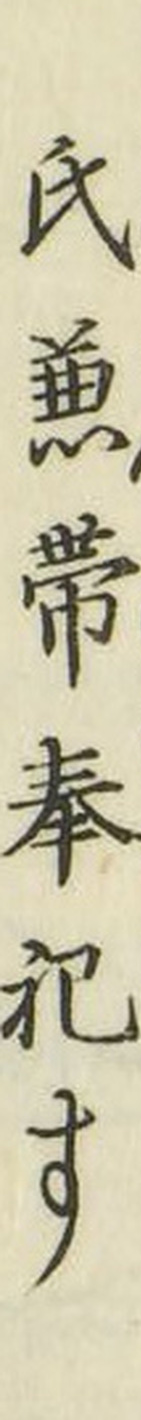氏兼帯奉祀す

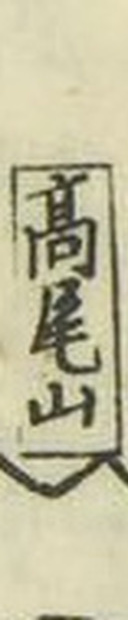高尾山
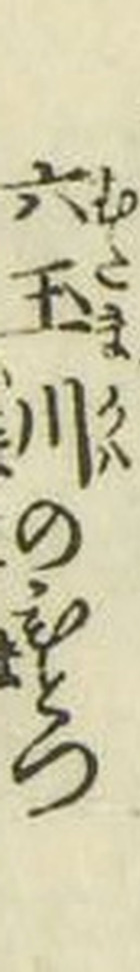六玉川のひとつ
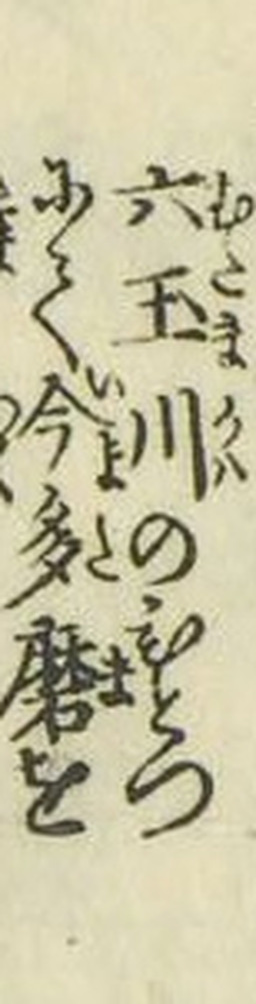にて今多磨を
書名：江戸名所図会 20巻 巻之10
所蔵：東京学芸大学教育コンテンツアーカイブ
